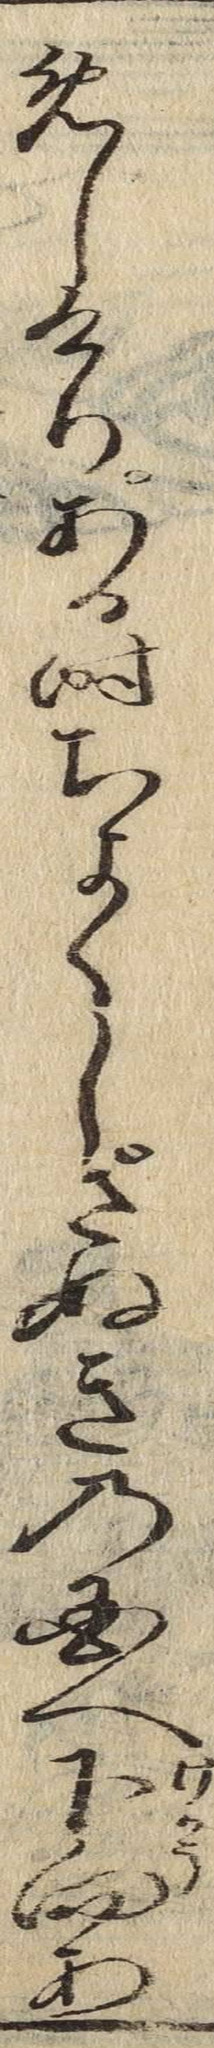めしけり。ある時ちよくし。さぬきの国へ下向あ
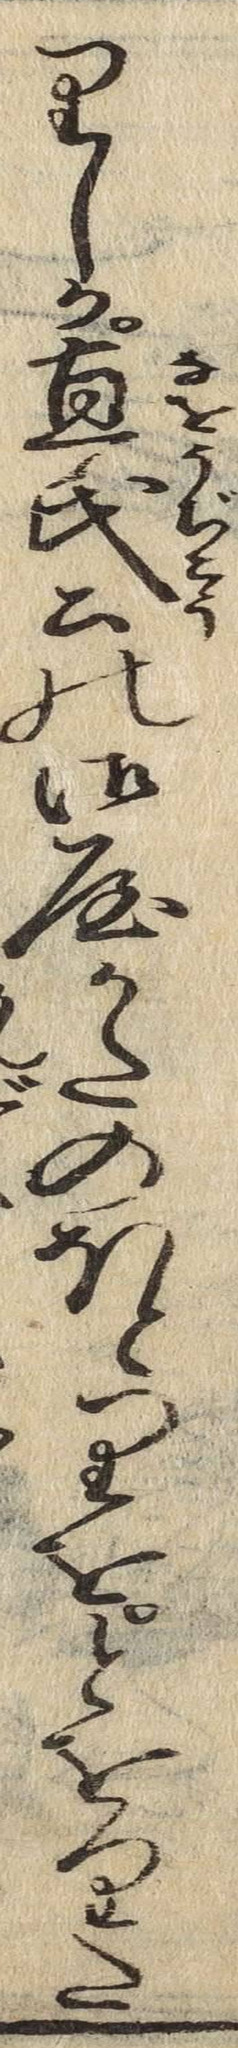りしか。直氏公の御やかたのほとりを。とをりた
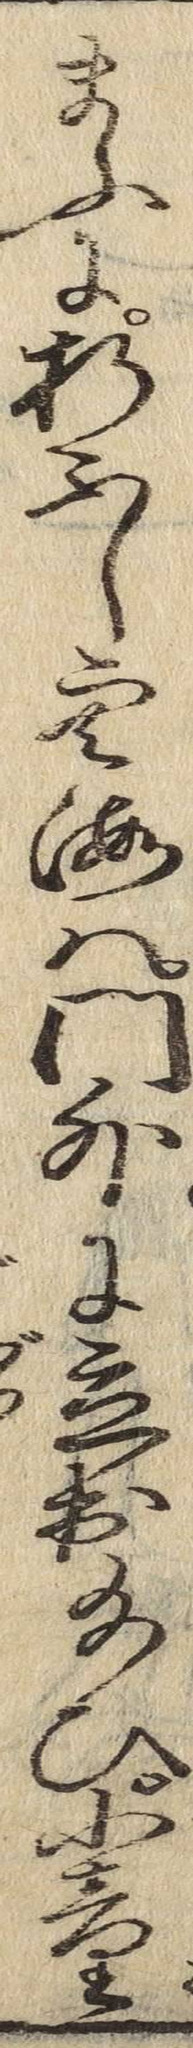まふに。折ふし空海は。門外に立出給ひ。小童
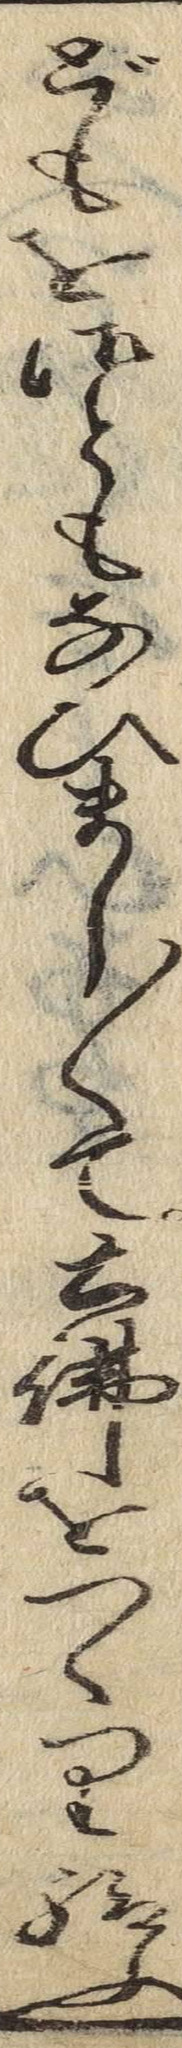どもを御ともなひまし〳〵て。土仏をつくり給ふ
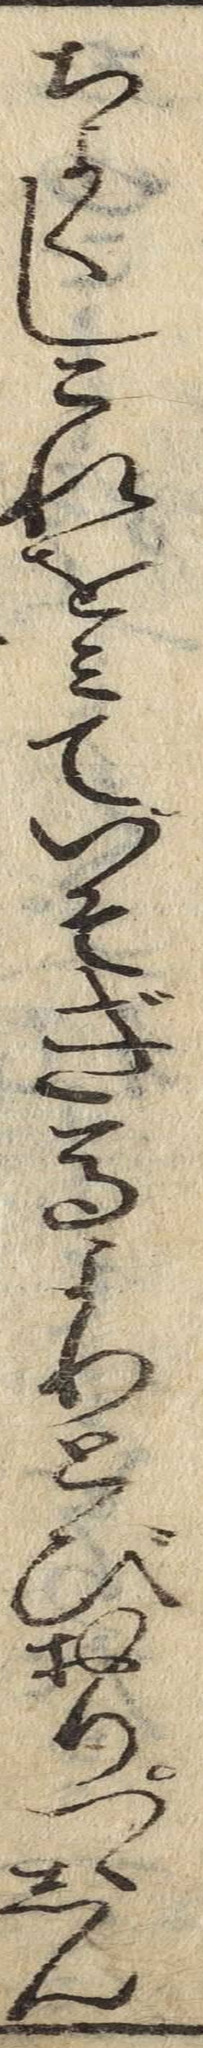ちよくしこれをみて。いそぎ馬よりとびおり。つゝしん
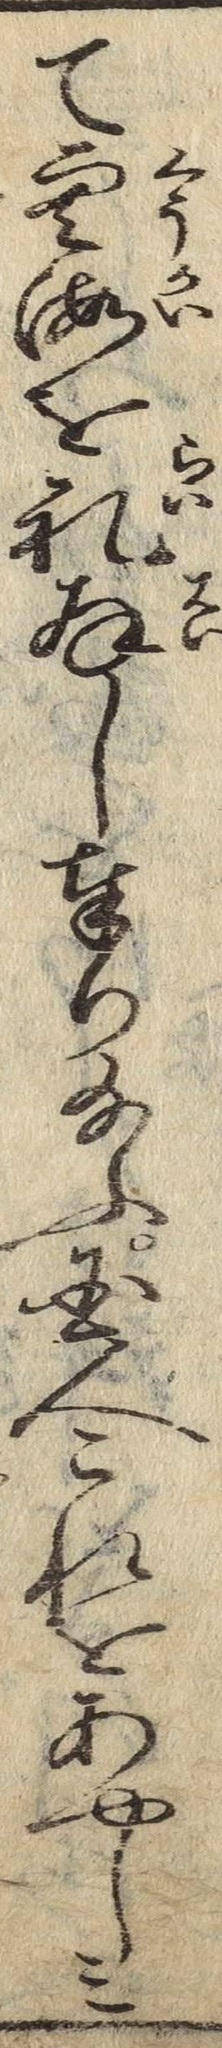て空海を礼拝し奉り給ふ。国人これをあやしみ
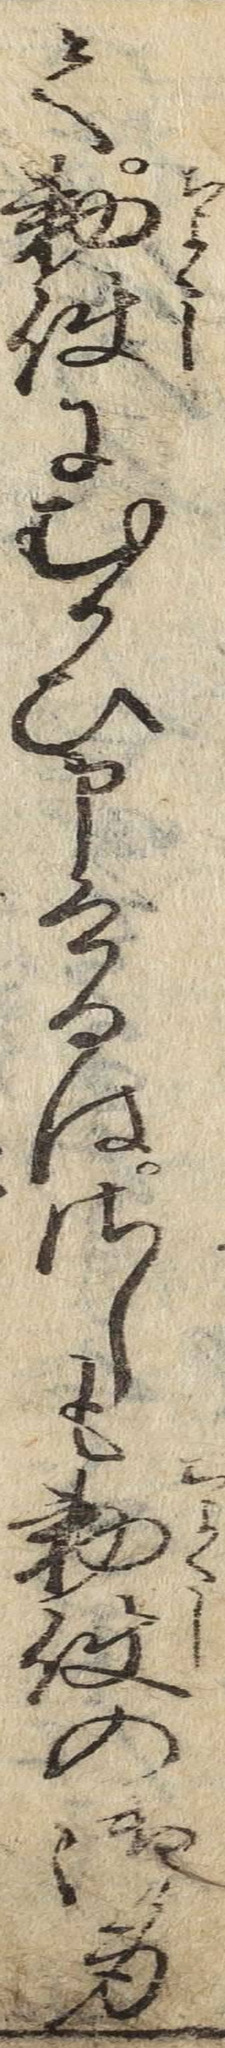て。勅使にむかひ申けるは。さしも勅使の御身
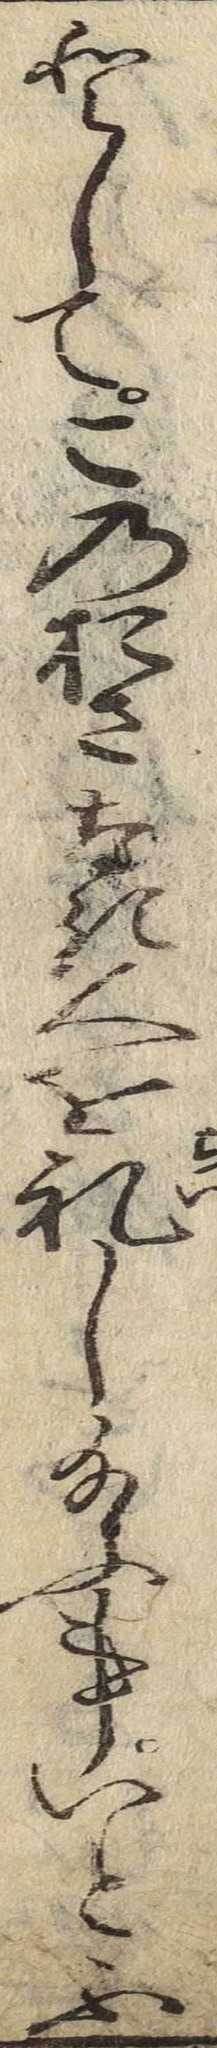として。このおさなき人を礼し給ふ事いとふし
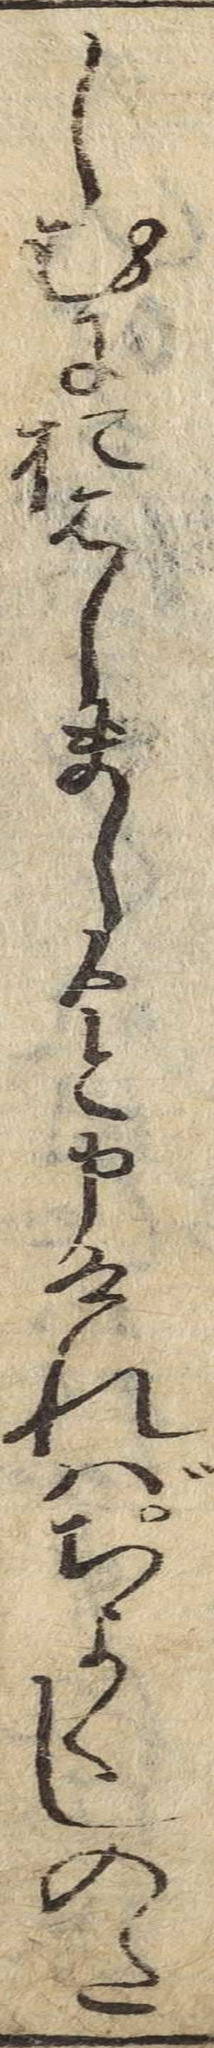むにおはしまし候と申ければ。ちよくしのた

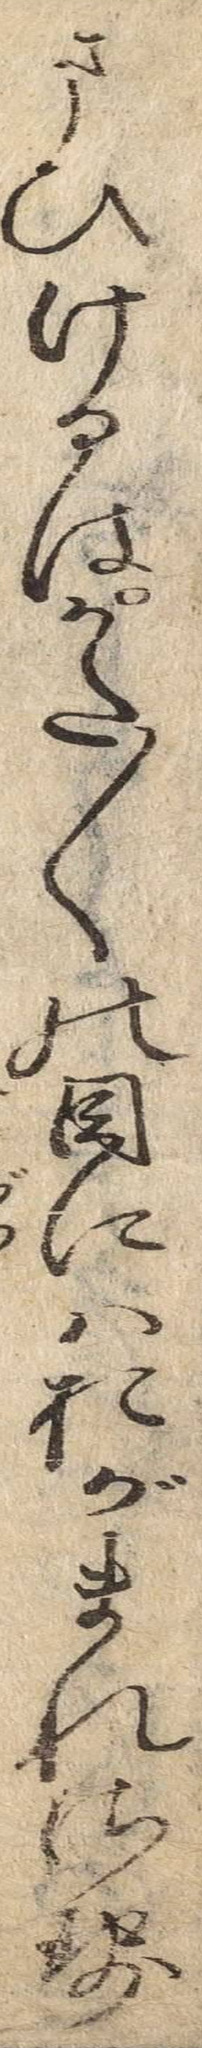まひけるは。かた〳〵の目にはおがまれさせ
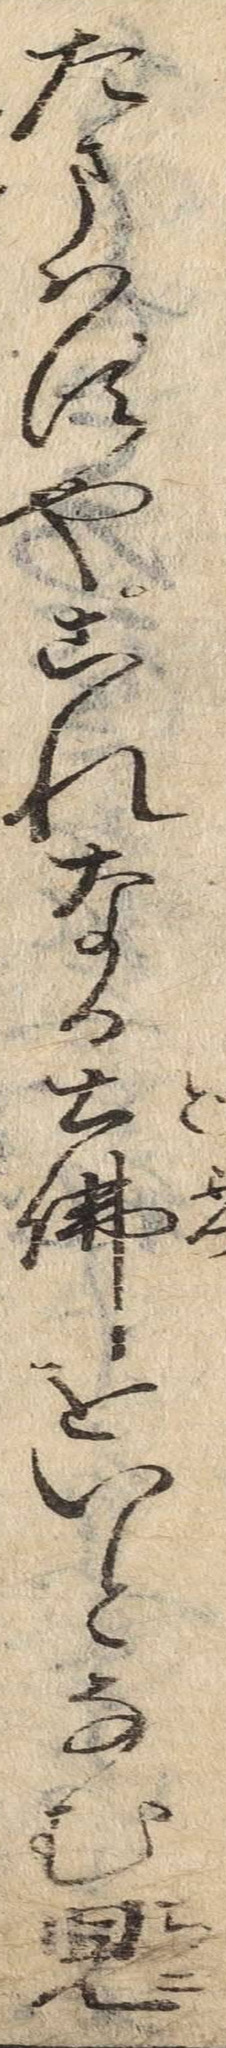たまはずや。これなる土仏をいとなむ児
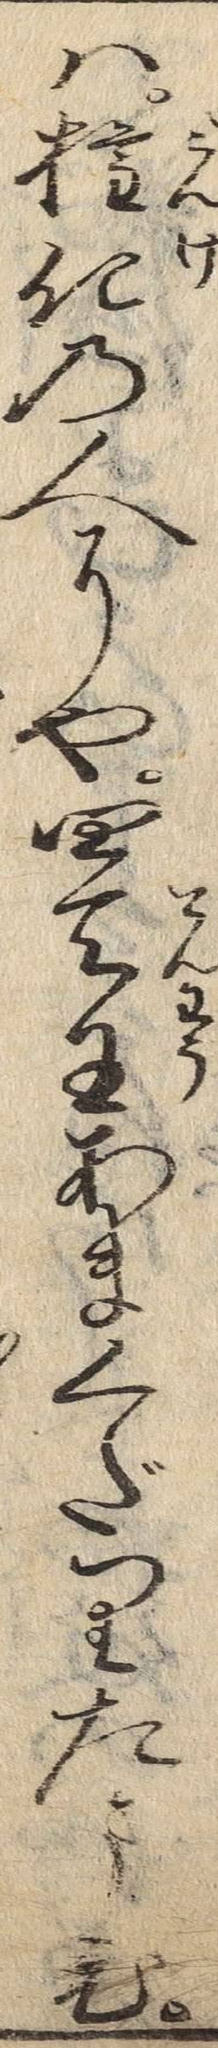は権化の人にや。四天王あまくだりたまひ。
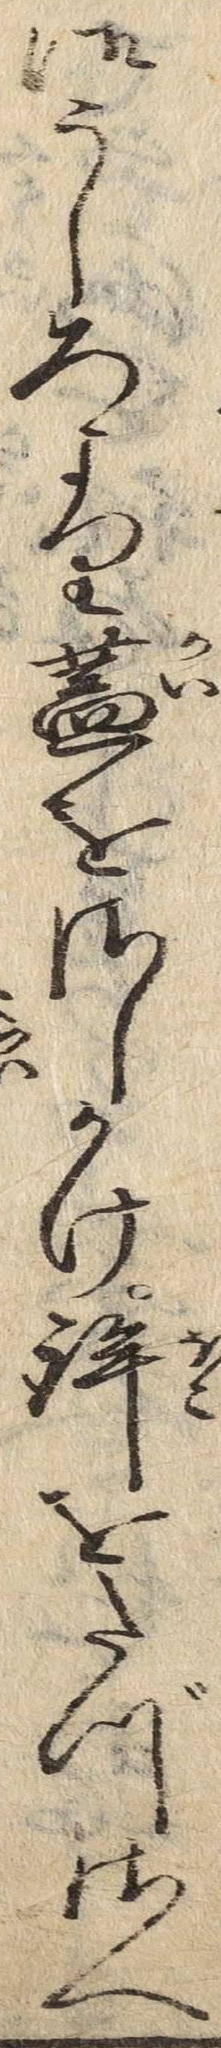御うしろより蓋をさしかけ。鉾をたづさへ
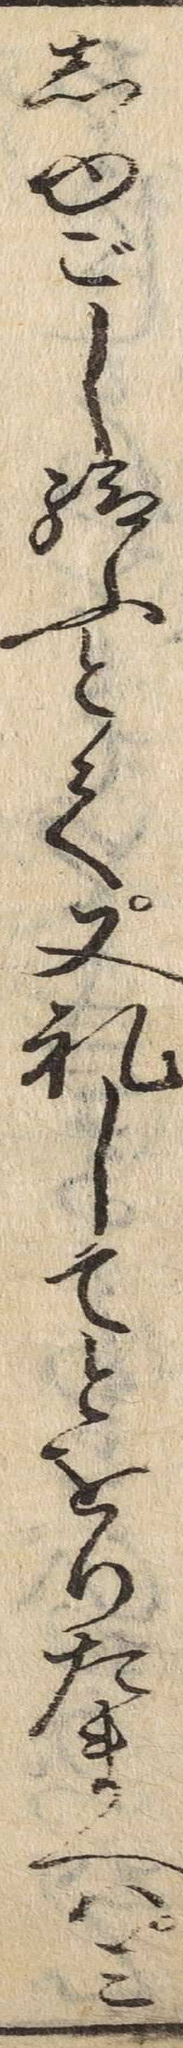しゆごし給ふとて。又礼してとをりたまへは。み
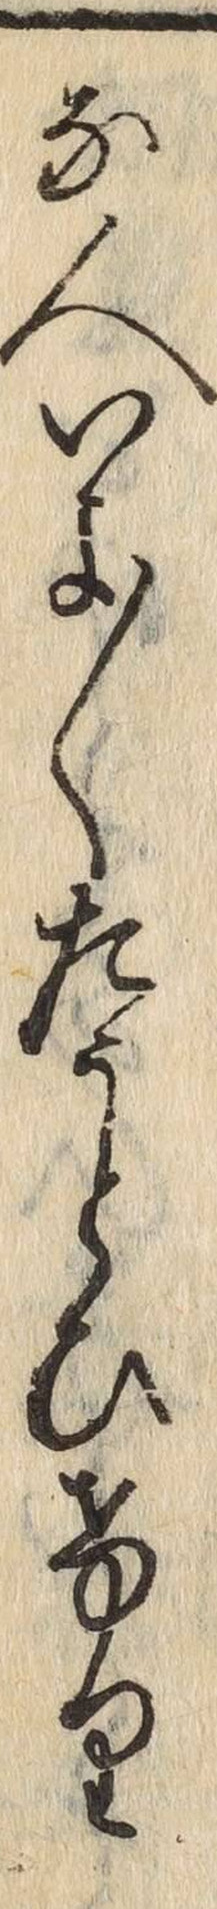な人いよ〳〵たうとひけり

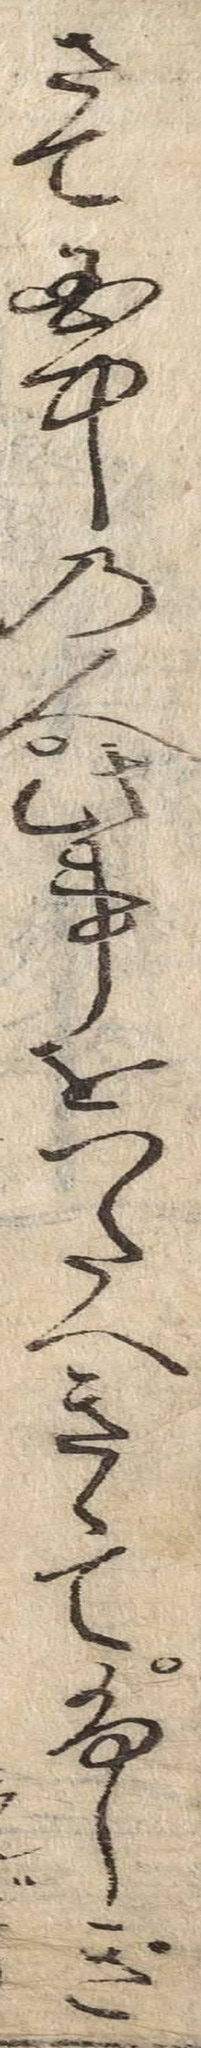さて国中の人。此事をつたへきゝて。ふしぎ
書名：弘法大師御傳記
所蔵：京都府立京都学・歴彩館 国文学研究資料館
